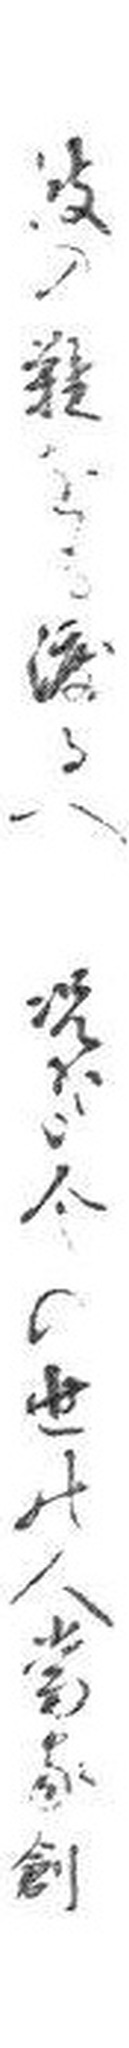波之難をも渡るへし况哉今の世の人当家創
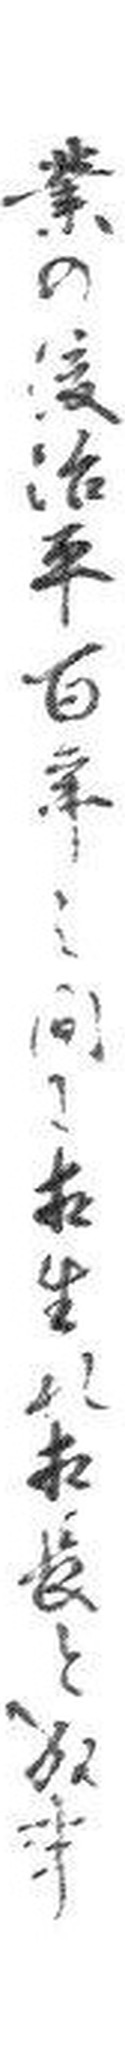業の後治平百年之間に相生れ相長と成事
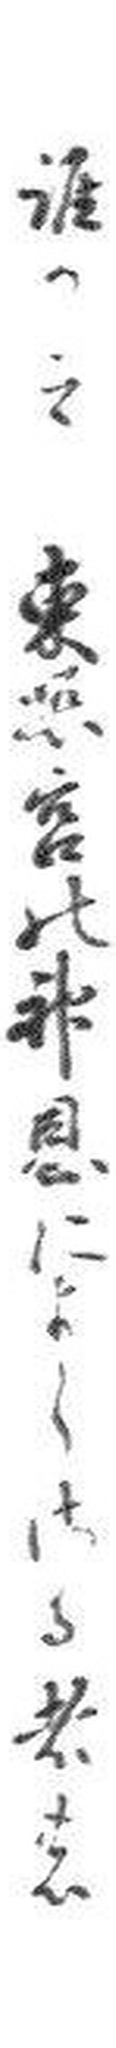誰か之東照宮の神恩によらさる者の
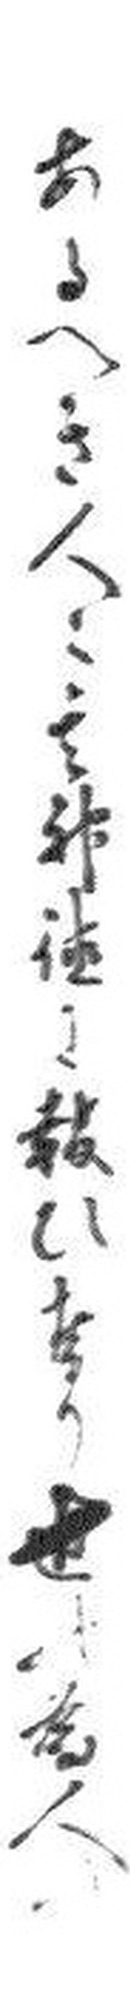あるへき人々其神徳に報ひ奉り世の為人の
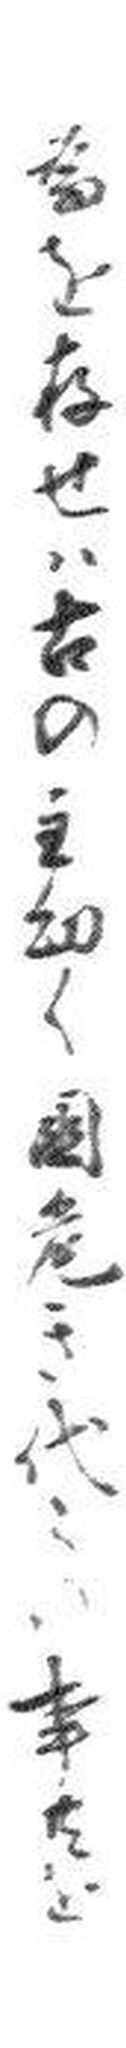為を存せハ古之主幼く国危き代々の事共を
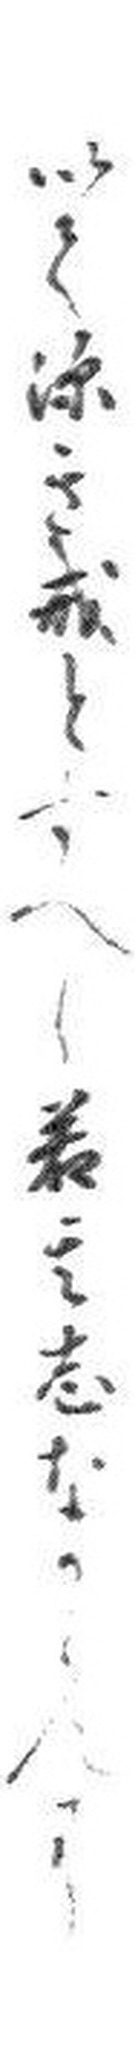以て深き戒とすへし若其志なからんに
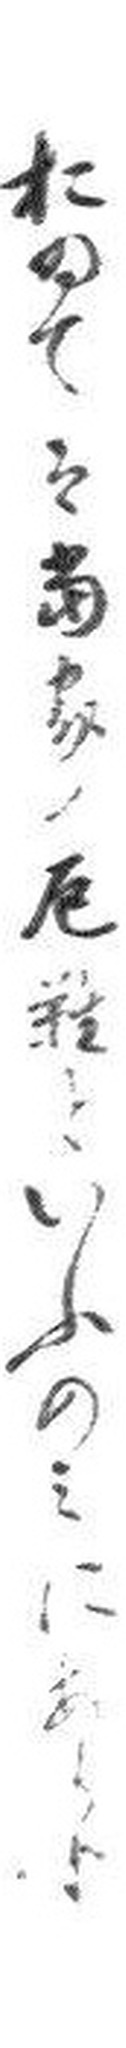おゐては当家ノ厄難といふのミにあらす
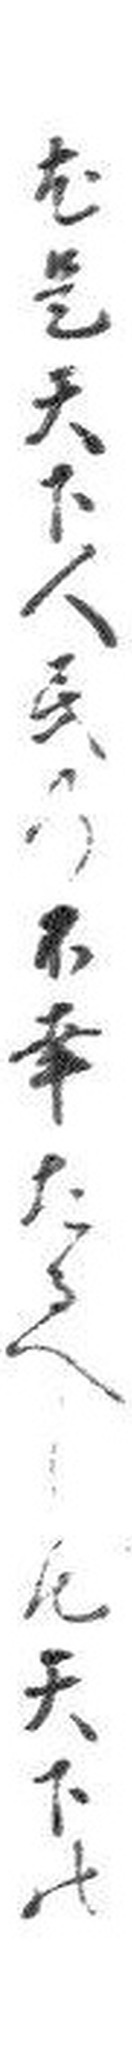尤是天下人民の不孝たるへし凡天下の
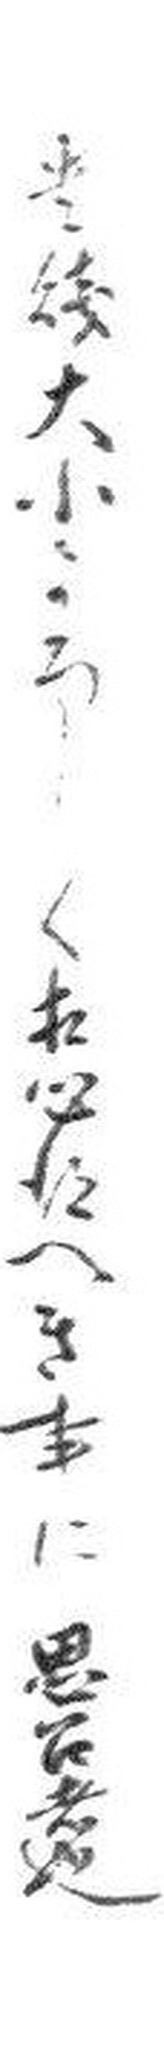貴賤大小よろしく相心得へき事に思召者也
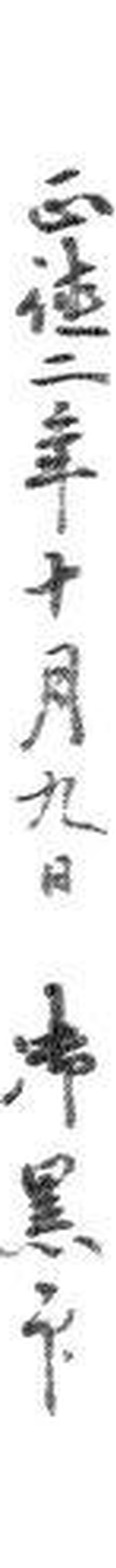正徳二年十月九日御黒印

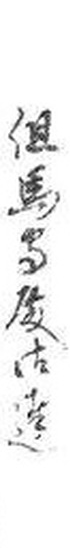但馬守殿御達
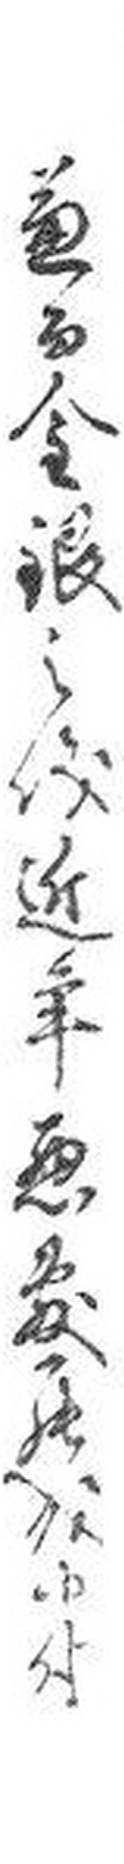兼而金銀之儀近年悪敷罷成候付
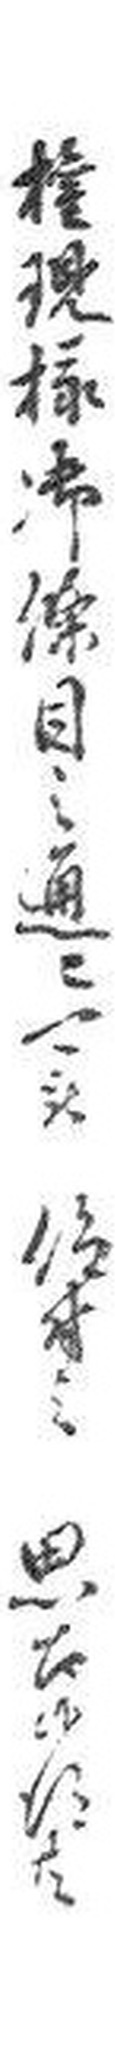権現様御條目之通ニ可被仰付之思召候得共
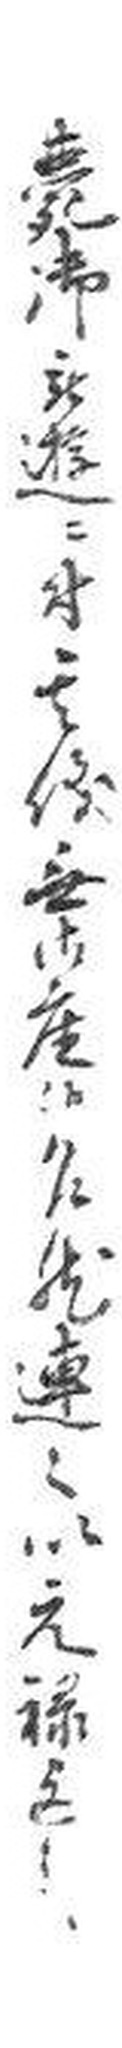薨御被遊ニ付其儀無御座候乍然連々以元禄迄之
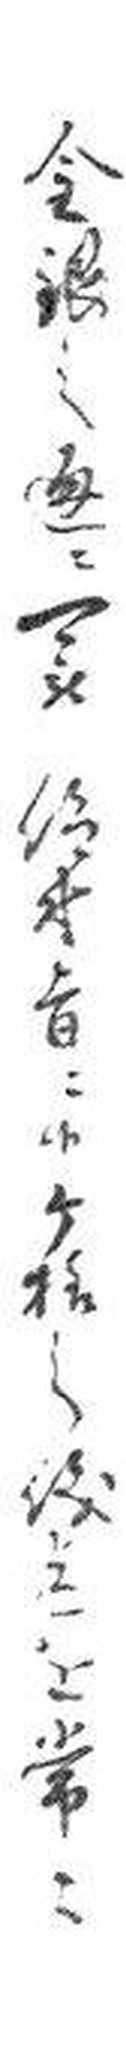金銀之通ニ可仰付旨ニ候ケ様之儀迄を常々
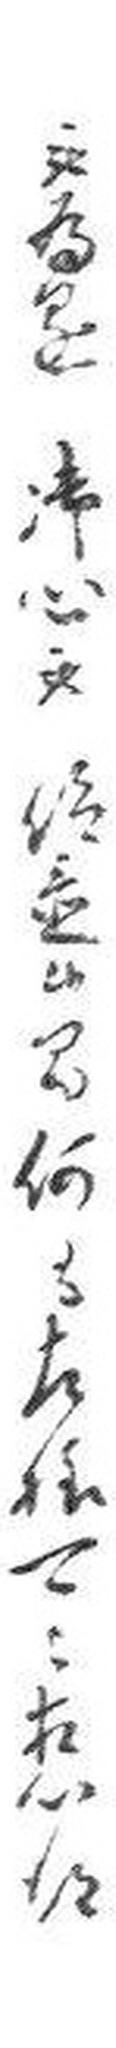被為懸御心被仰置候間何も左様可被相心得
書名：家譜 二十九 吉邦公 従正徳二年到正徳三年
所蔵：福井県文書館 Fukui Prefectural Archives
